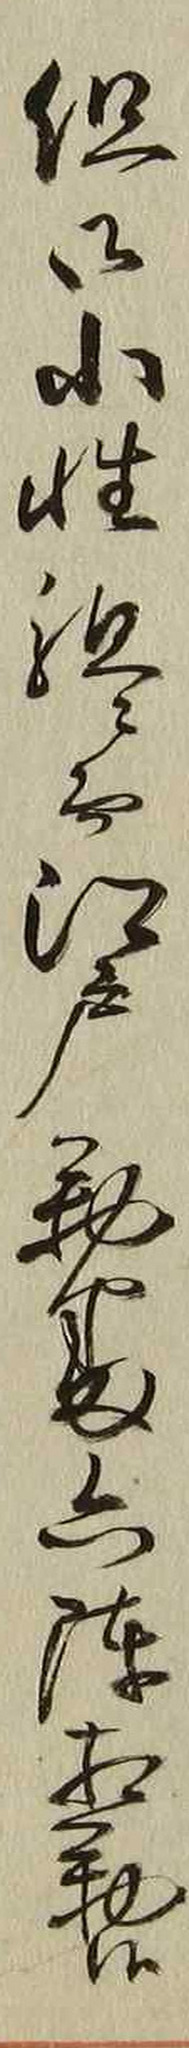但御小性組ニ而江戸勤番六陣相勤候
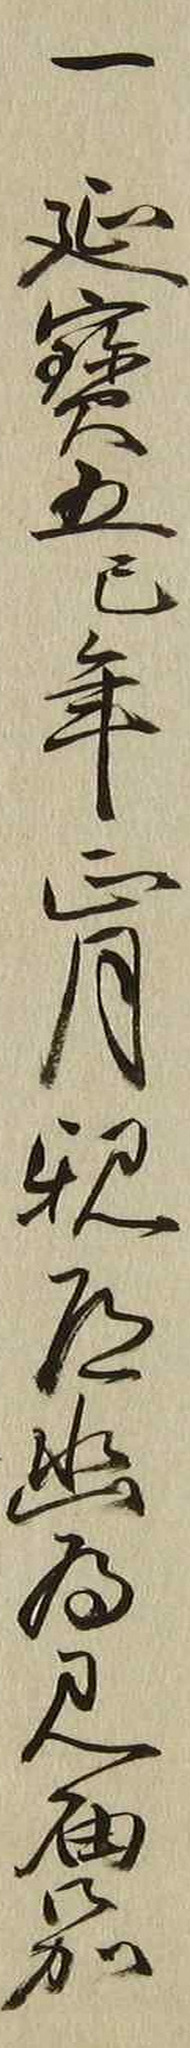一延宝五巳年正月親道幽為見届御加
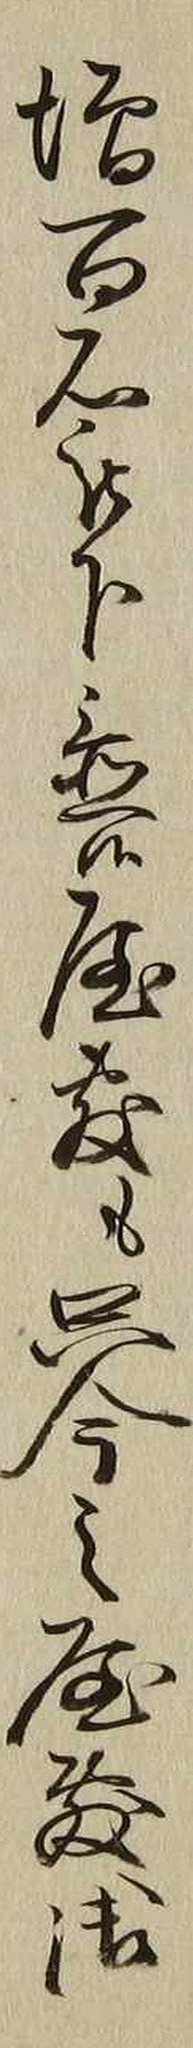増百石被下置候屋敷も只今之屋敷へ御
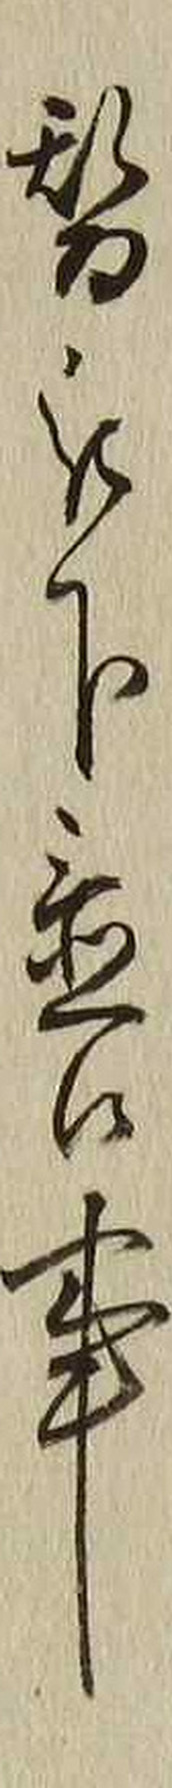替被下置候事
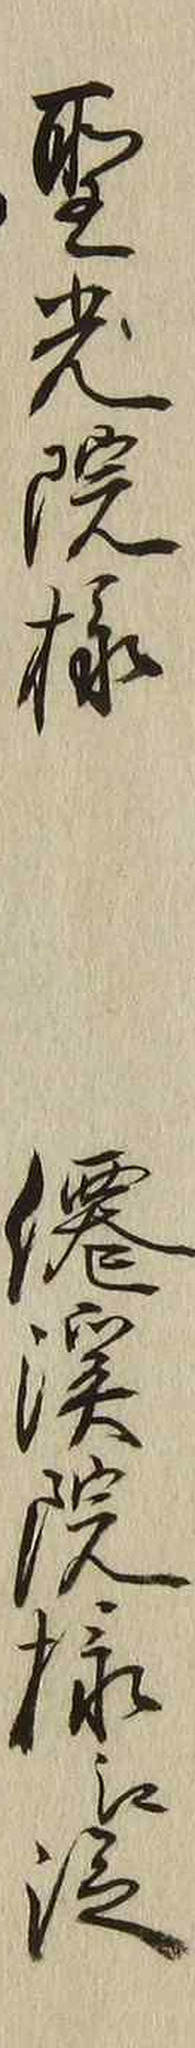聖光院様遷渓院様江従
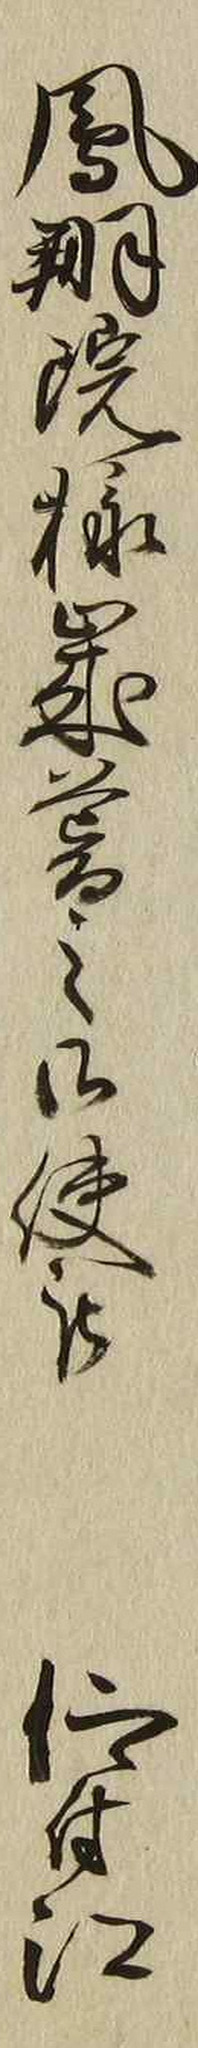鳳翔院様歳暮之御使被仰付江
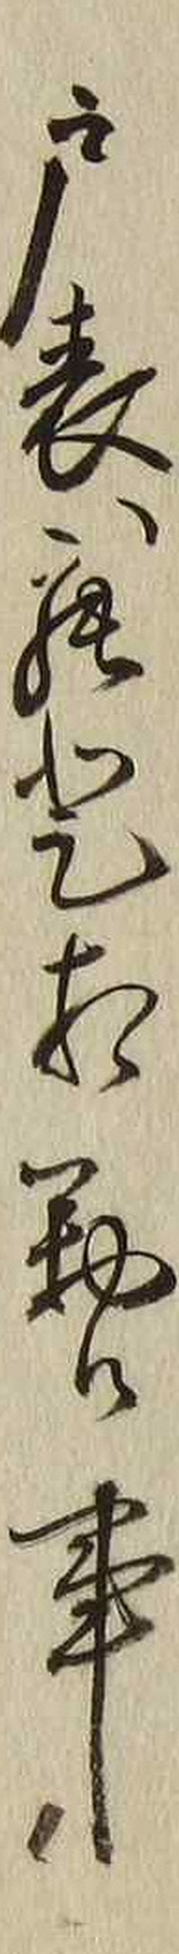戸表へ罷登相勤候事
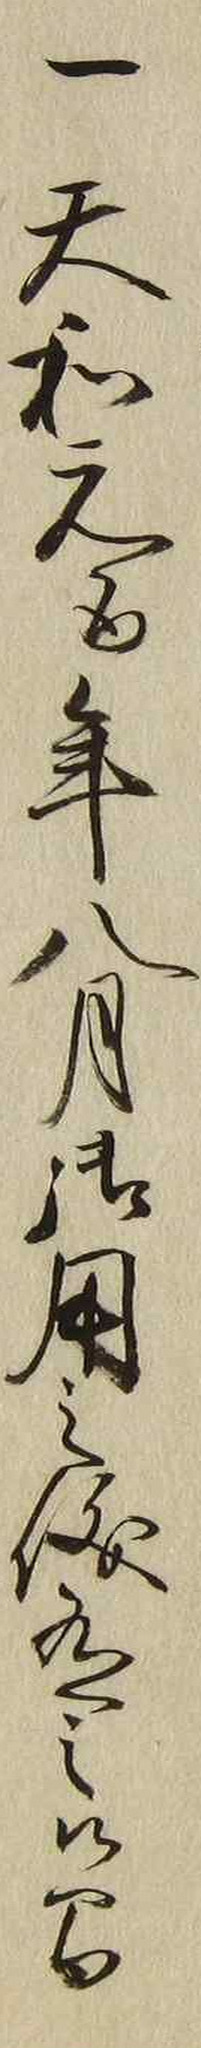一天和元酉年八月御用之儀有之候間
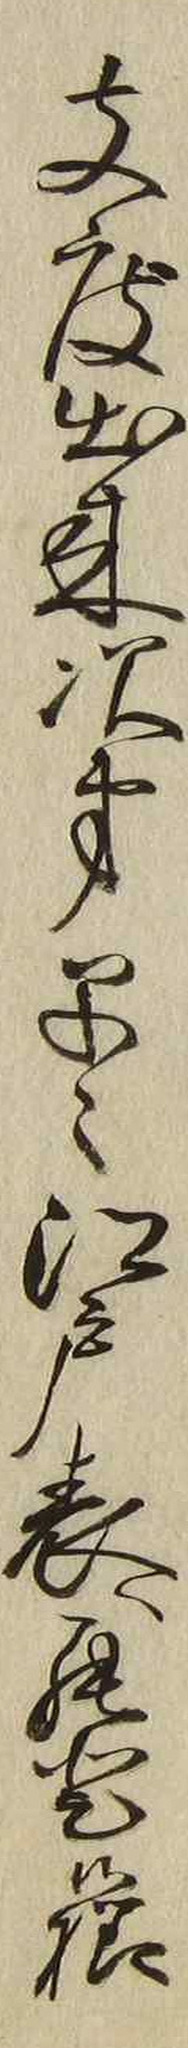支度出来次第早々江戸表へ罷登候様
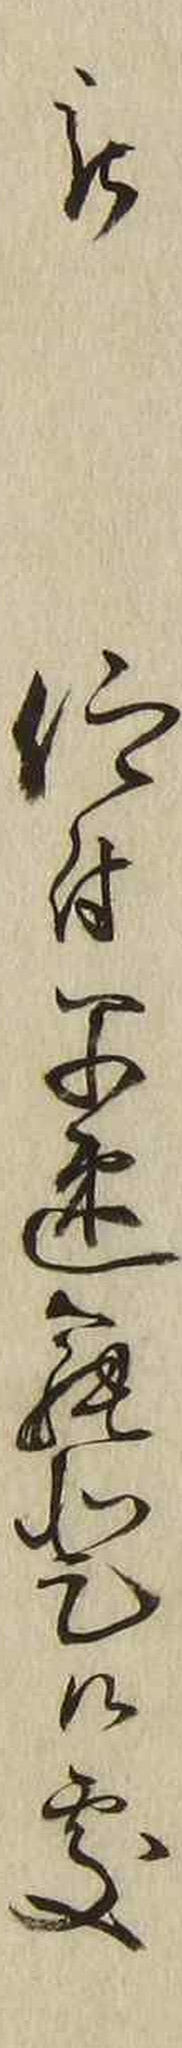被仰付早速罷登候処
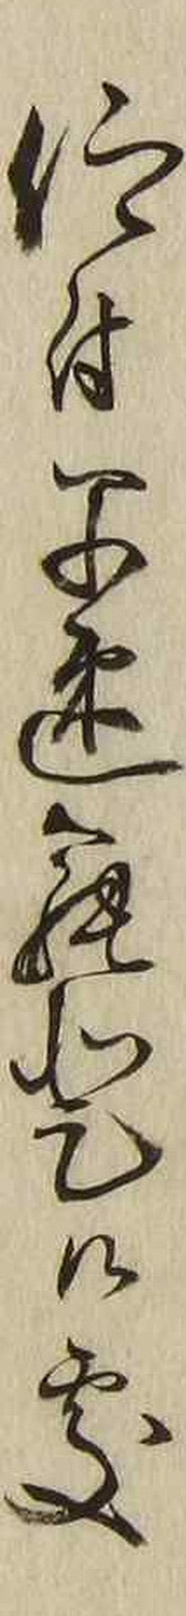被仰付早速罷登候処

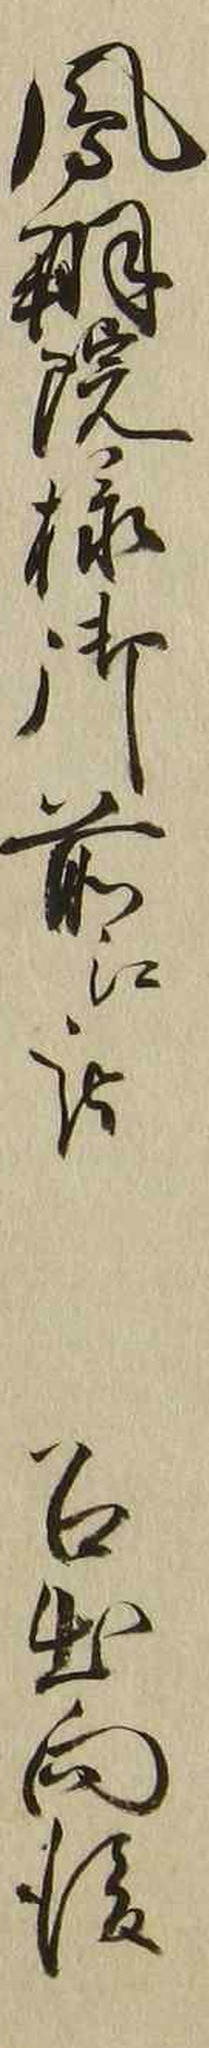鳳翔院様御前江被召出向後
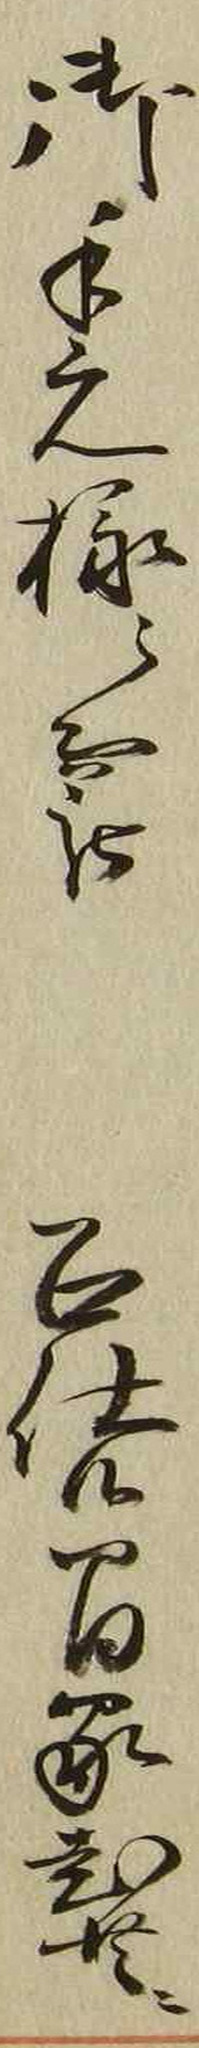御手元様ニ而被召仕候間家老共ニ
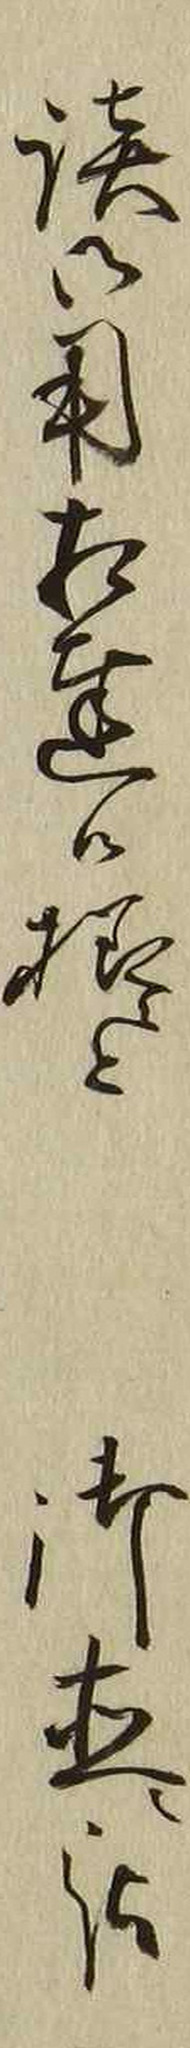談御用相達候様ニと御直ニ被
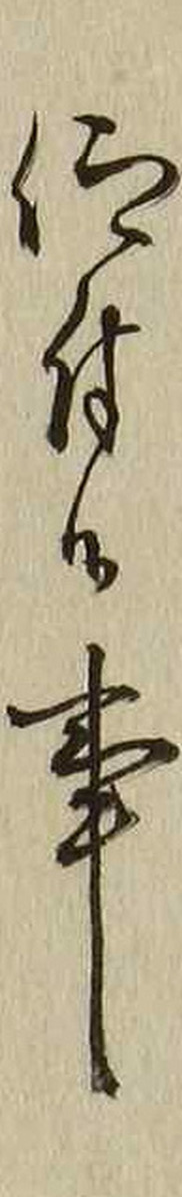仰付候事
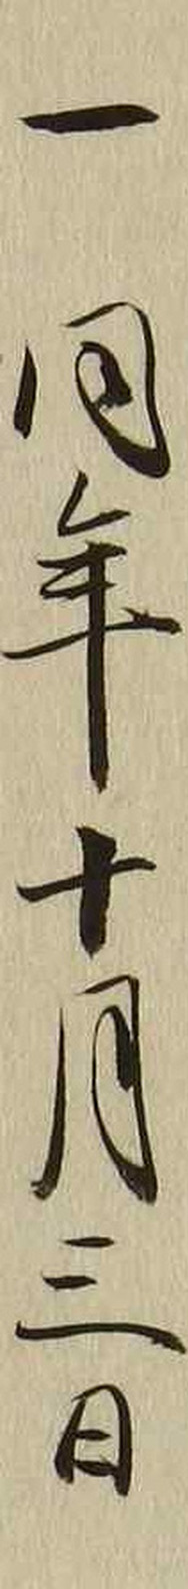一同年十月三日
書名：諸士系譜　巻之60　と之部3
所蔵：会津若松市立会津図書館
